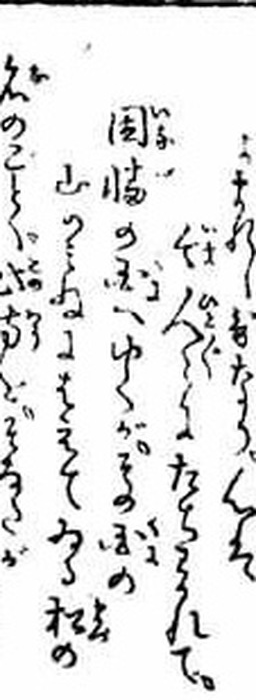因幡の国へゆくがその国の
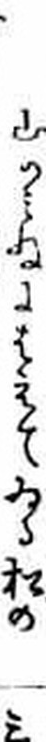山のみねにはえてゐる松の言
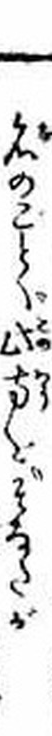名のごとく此の此方をそなたが
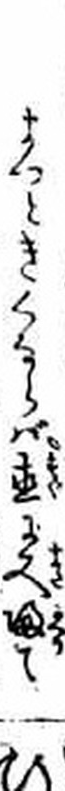まつときくならば直に立帰て行
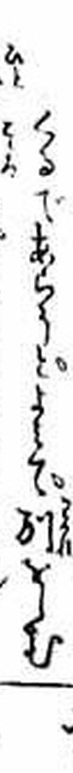くるであらうとよみて別をしむ
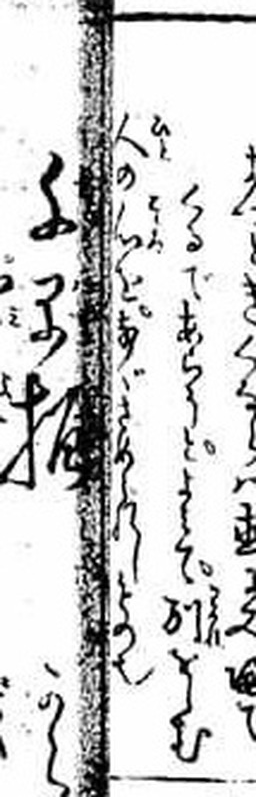人の心をなぐさめられしもの也平
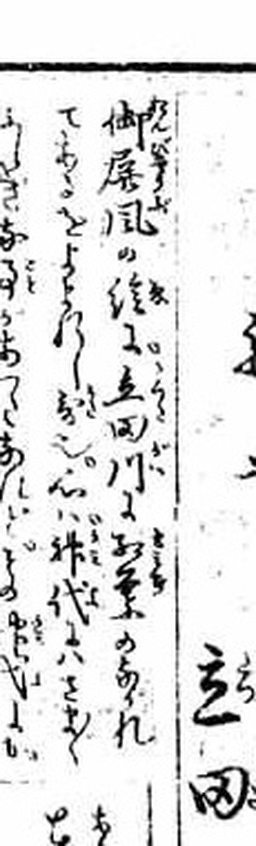御屏風の絵に立田川に紅葉のながれ
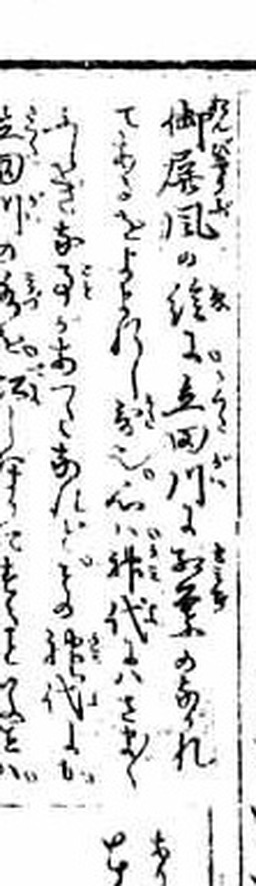てあるをよまれし哥なり心は神代にはさま〳〵在
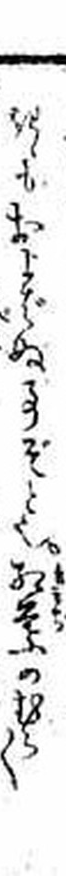きゝもおよばぬ事ぞと也紅葉のはら〳〵
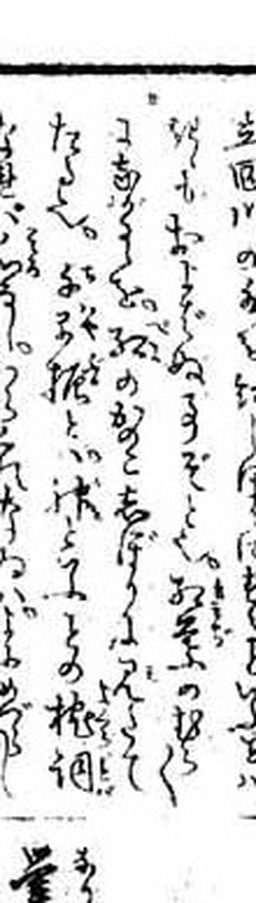にながるゝを紅のかのこしぼりに見たて
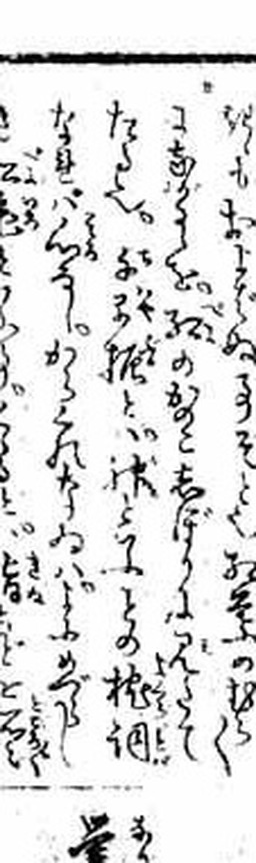たる也千早振とは神といふことの枕詞
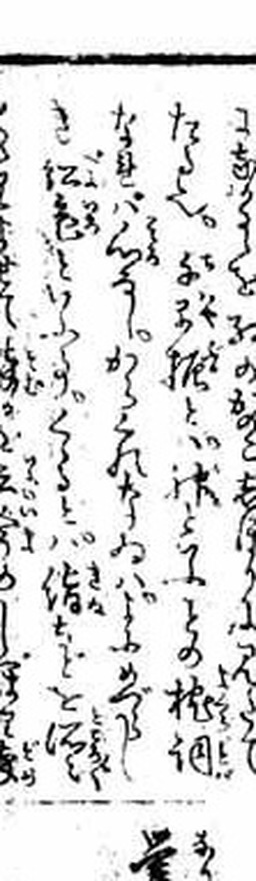なれば心なしからくれなゐはよにめづから業平
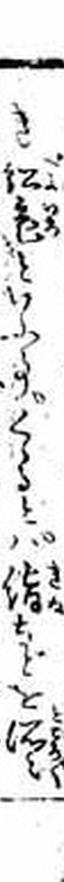きべき紅色といふ事くゝるとは絹などに所々
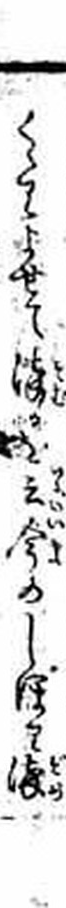くゝりよせて染るを云う今のしぼり染朝臣
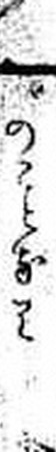のことなり

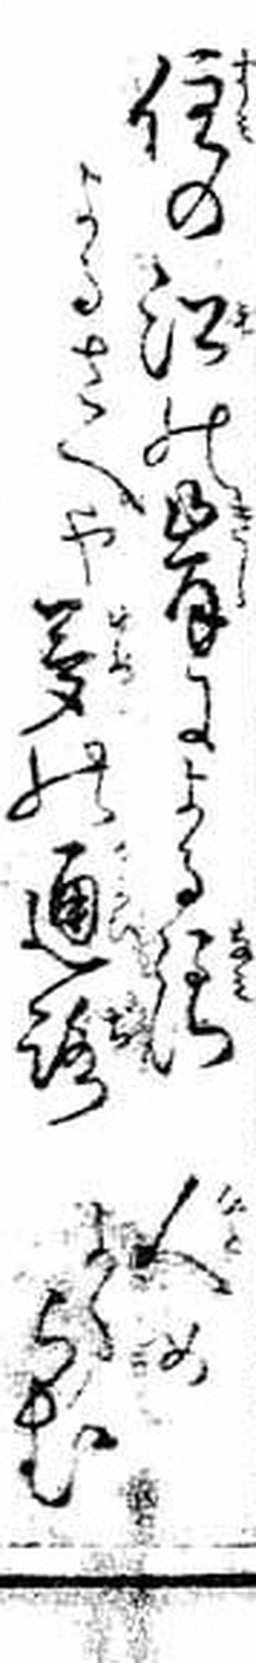よるさへや夢の通路よく
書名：小倉百人一首
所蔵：東京学芸大学教育コンテンツアーカイブ
